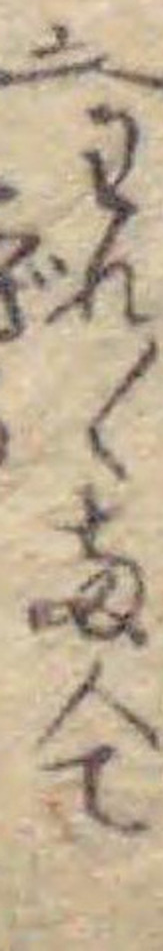われ〳〵両人て
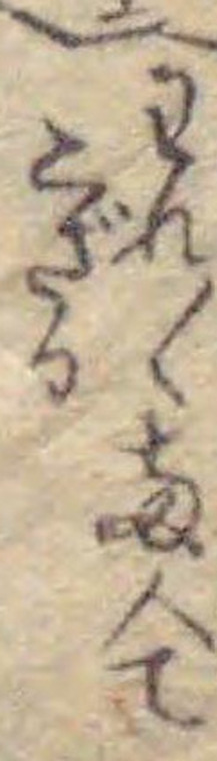こざる
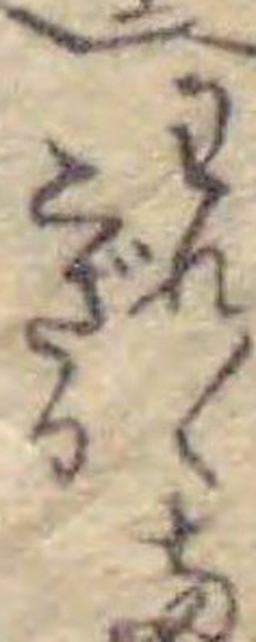こざる
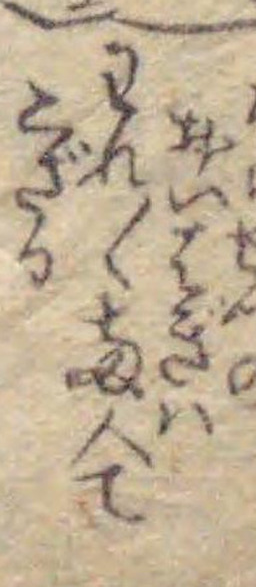われ〳〵両人て
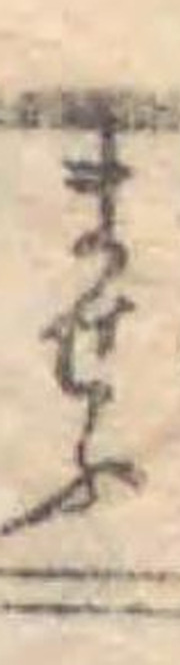ませふ
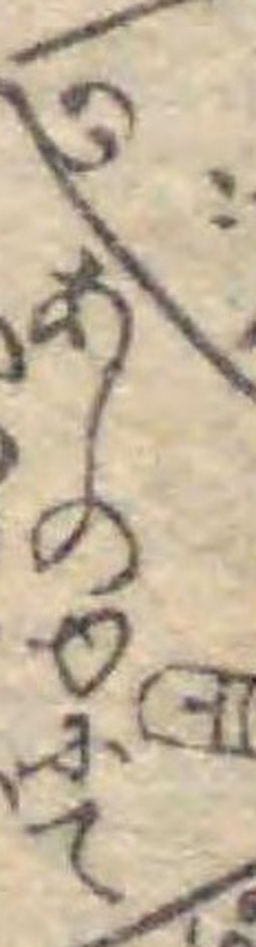あしのゆにて
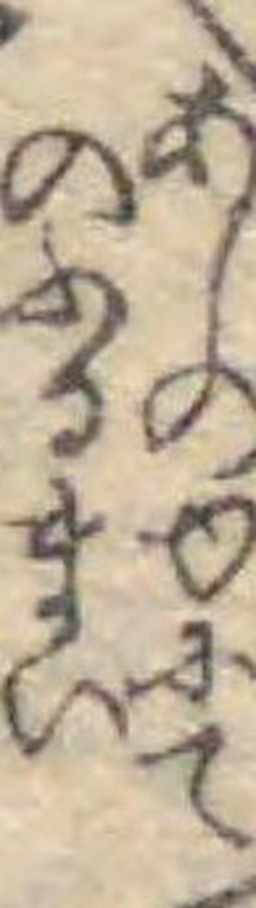のふるまい
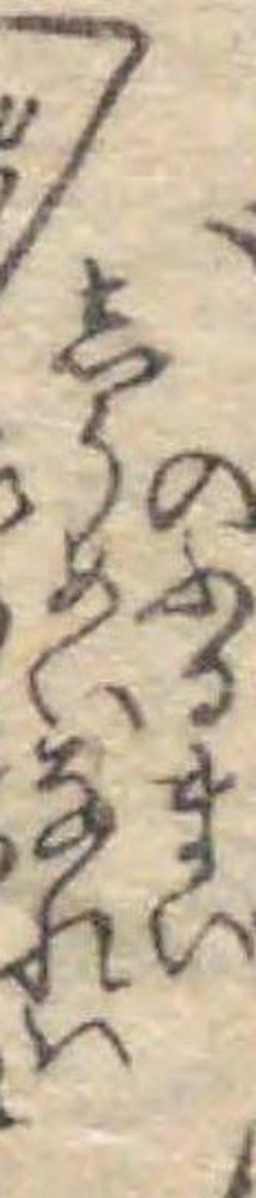しうめいなれは
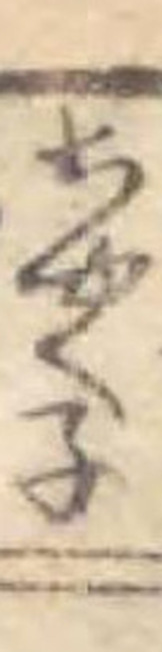ちやく子
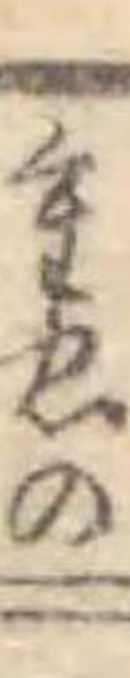重忠の
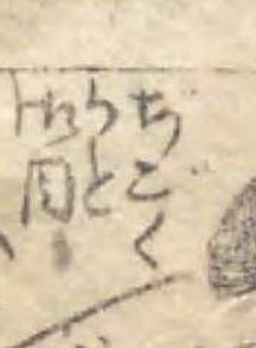どごく
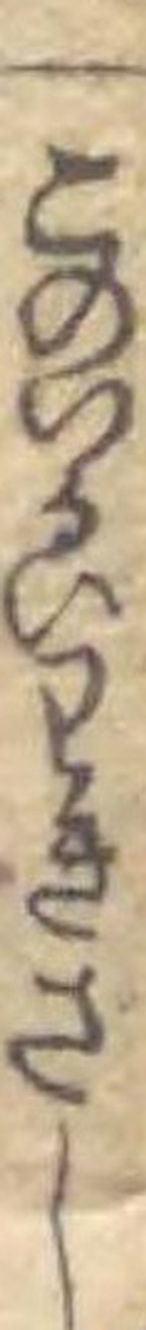このいるいわきざし
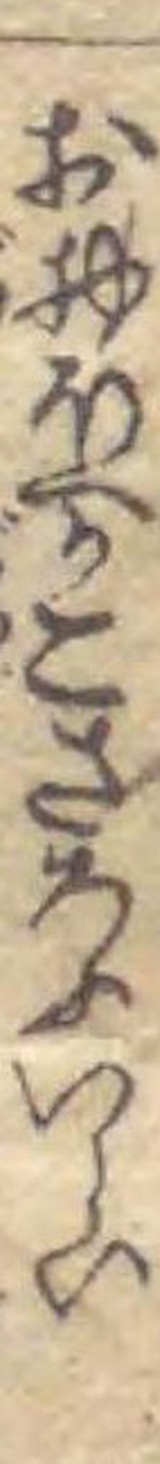おおほえかこさろふいらい
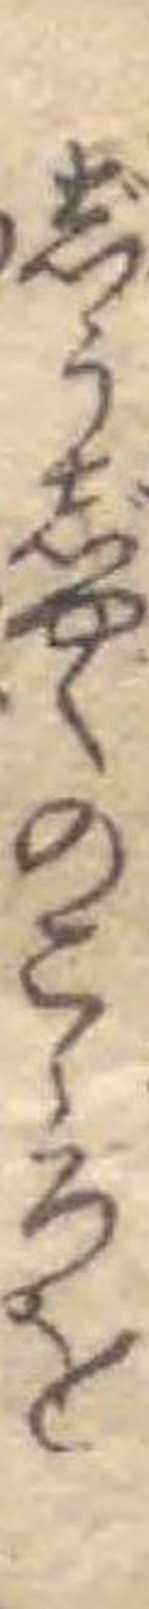じうじやくのこゝろを
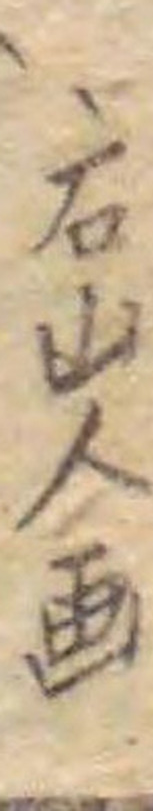石山人画
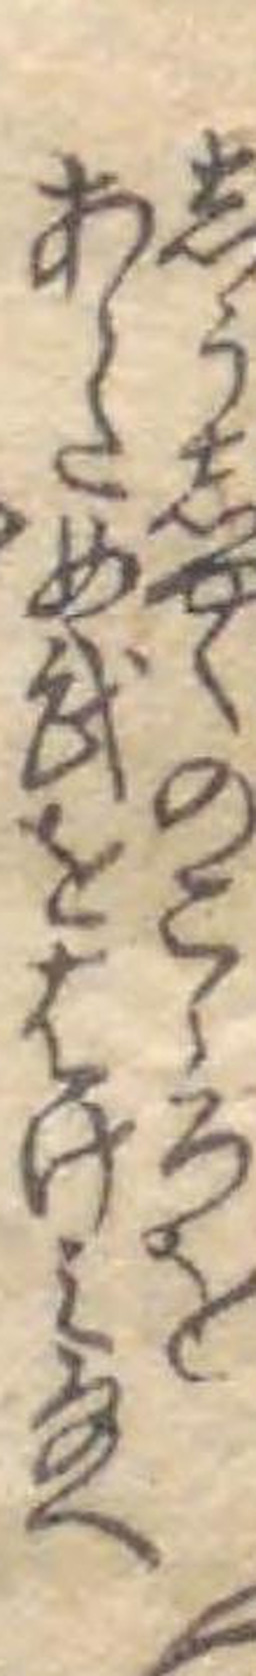あらため武をはけみなへ
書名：文武二道万石通 : 3巻
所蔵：国立国会図書館 National Diet Library, JAPAN
